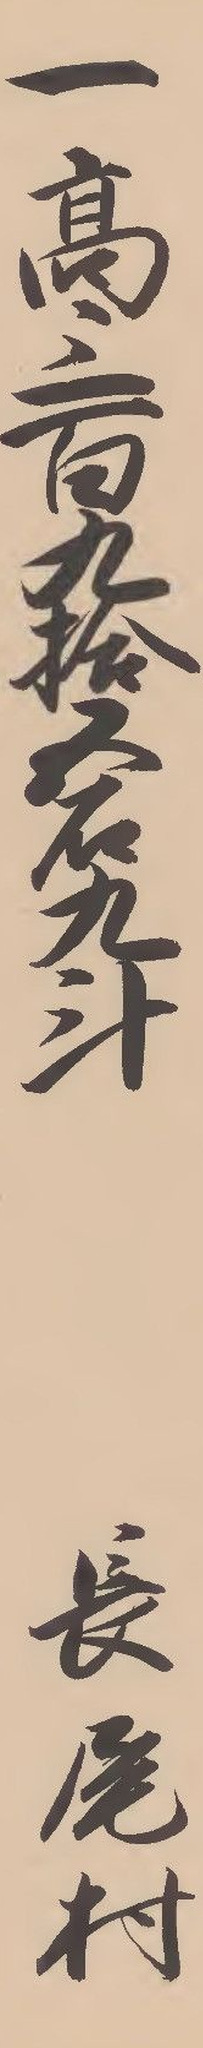一高三百九拾五石九斗長尾村
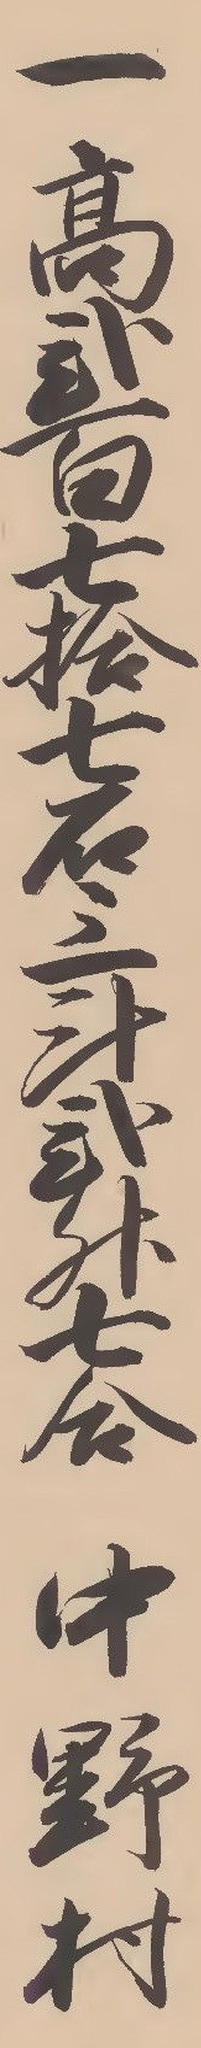一高弐百七拾七石三斗弐升七合中野村
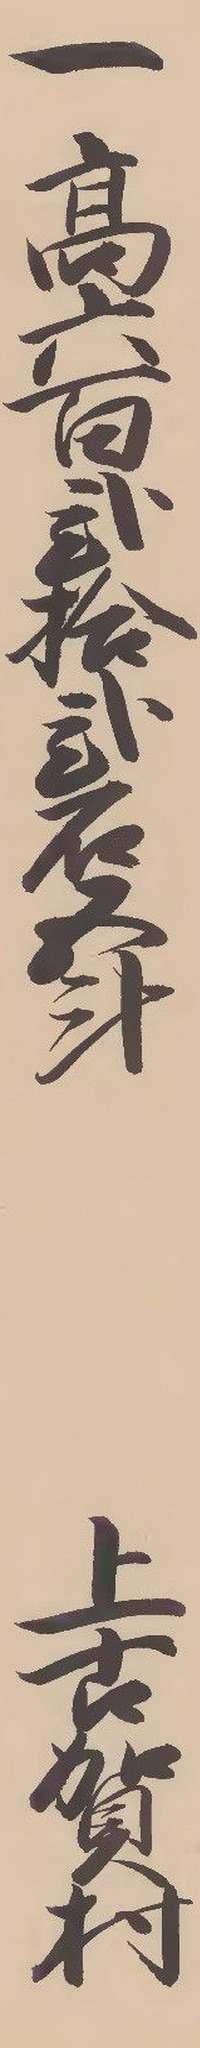一高六百弐拾弐石五斗上古賀村

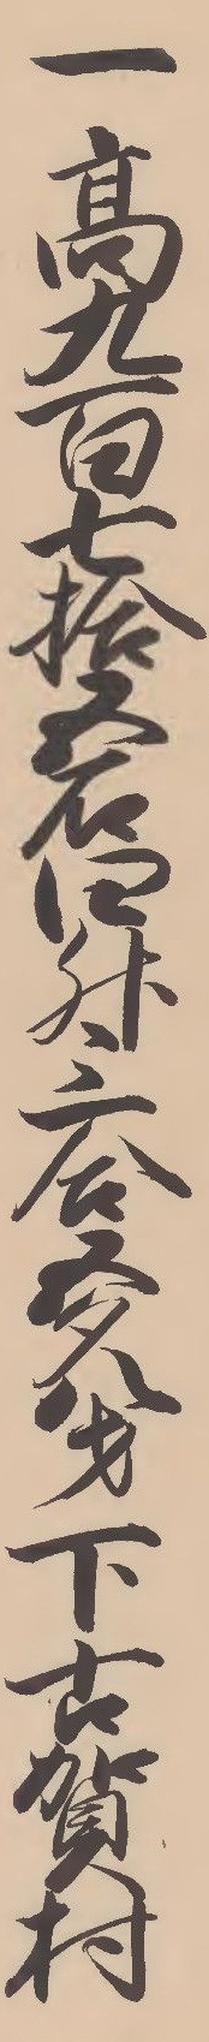一高九百七拾五石四升三合五勺八才下古賀村
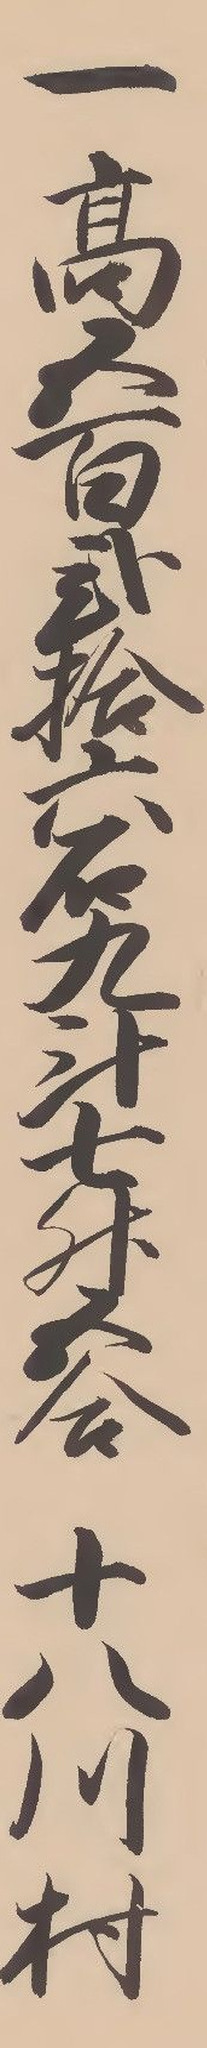一高五百弐拾六石九斗七升五合十八川村
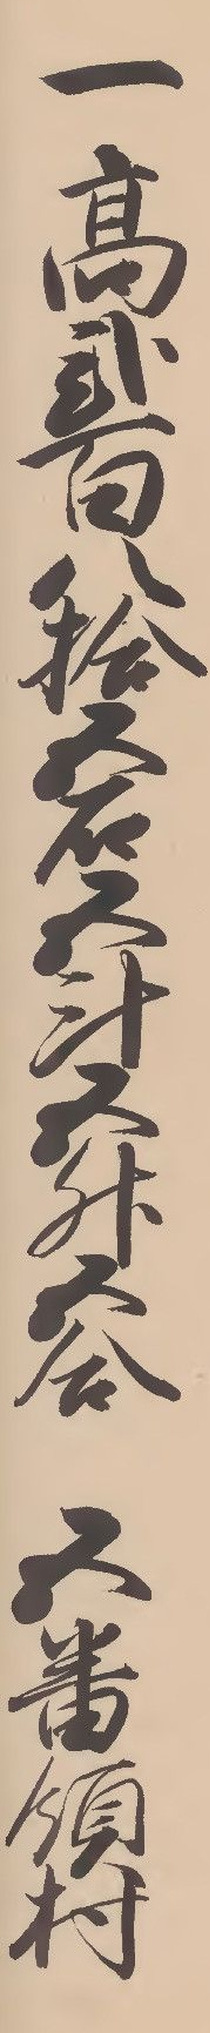一高弐百八拾五石五斗五升五合五番領村
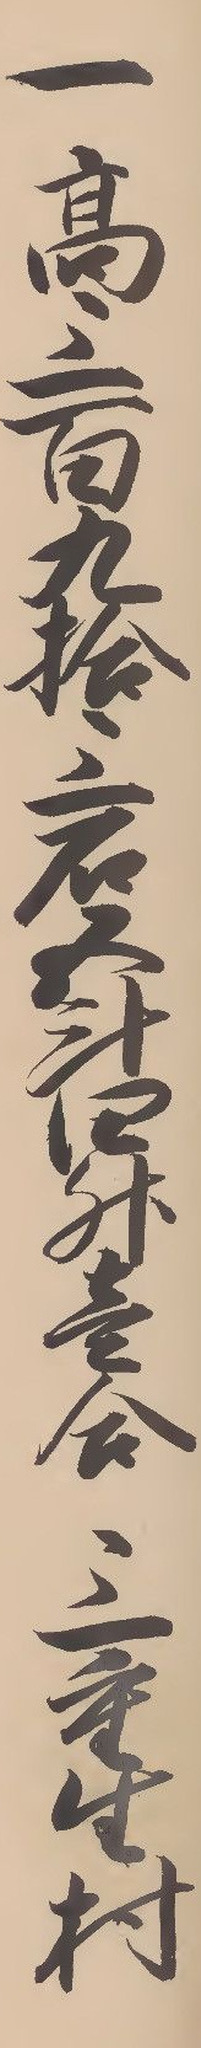一高三百九拾三石五斗四升壱合三重生村
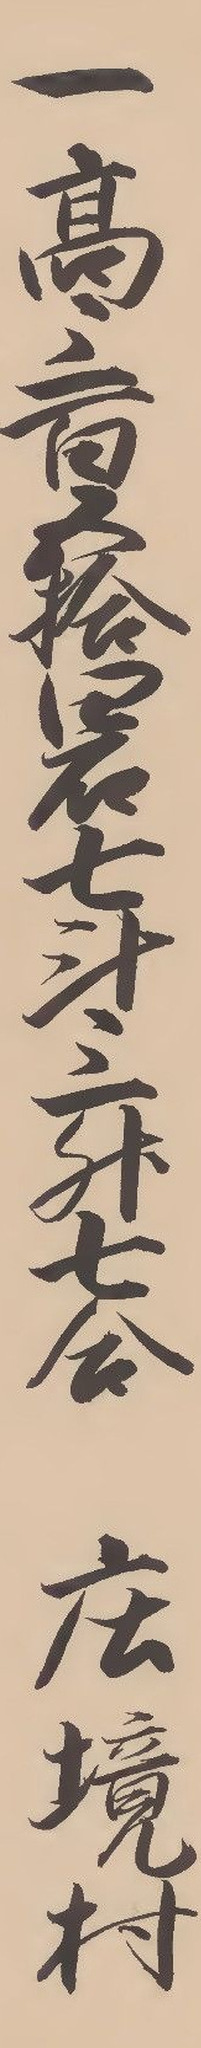一高三百五拾四石七斗三升七合庄境村
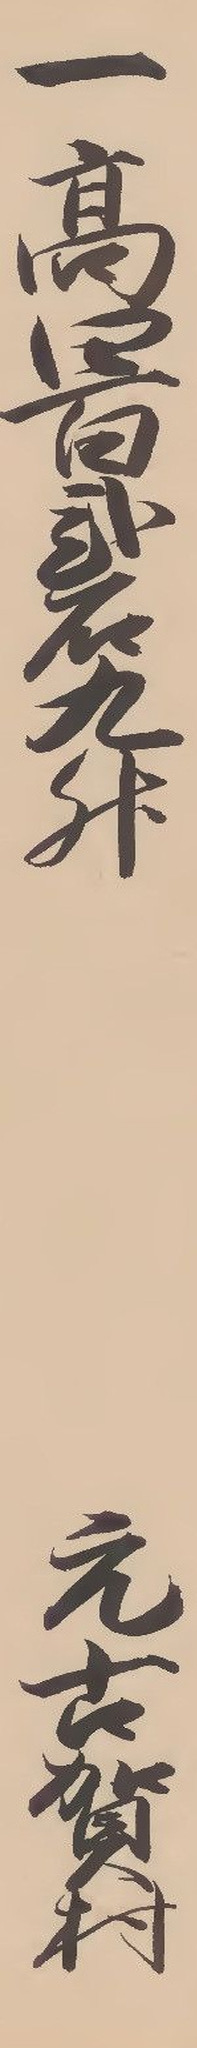一高四百弐石九升元古賀村
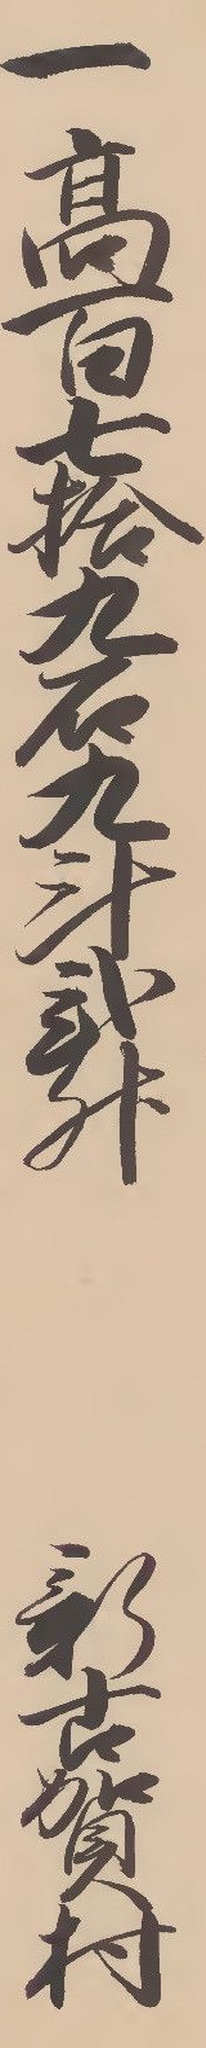一高百七拾九石九斗弐升新古賀村

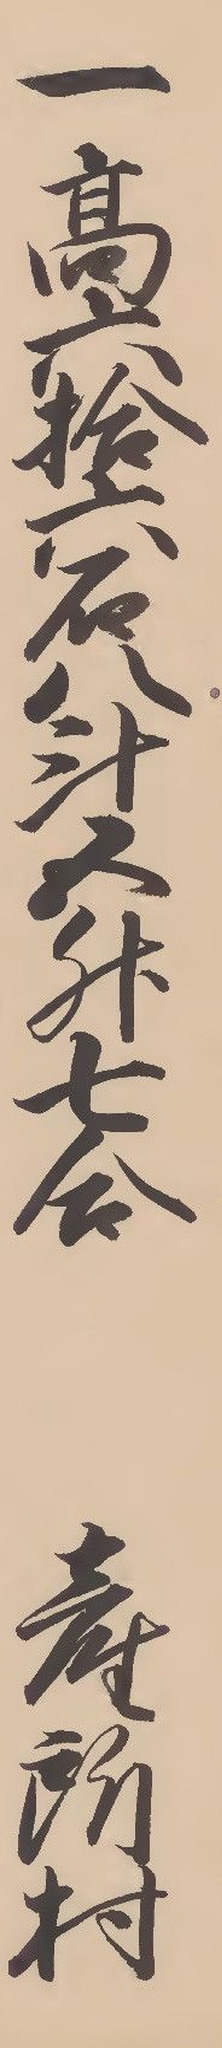一高六拾六石八斗五升七合産所村
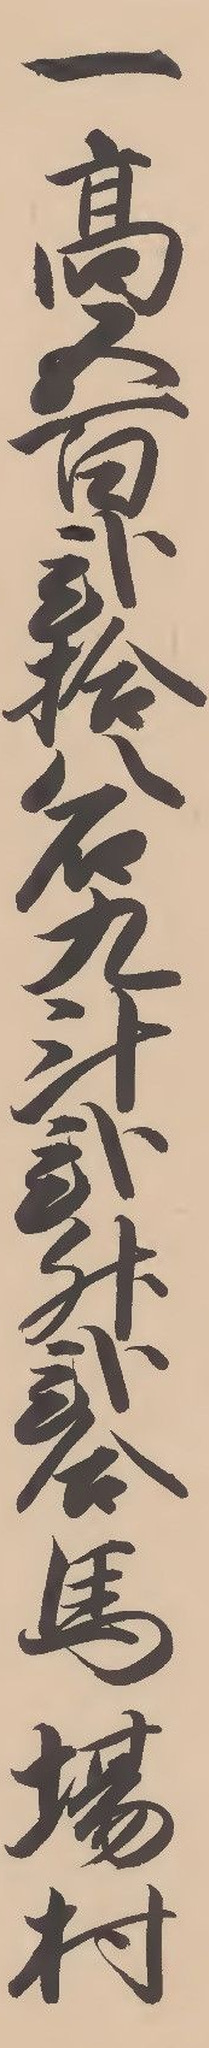一高五百弐拾八石九斗弐升弐合馬場村
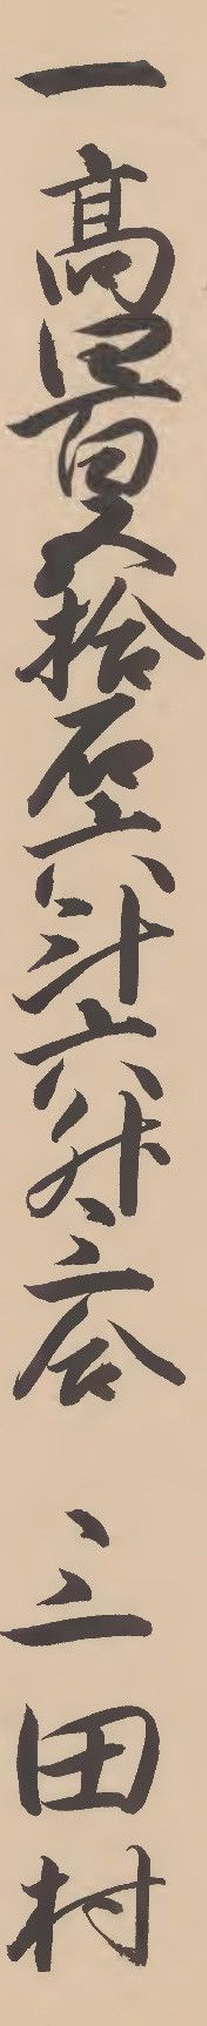一高四百五拾石六斗六升三合三田村
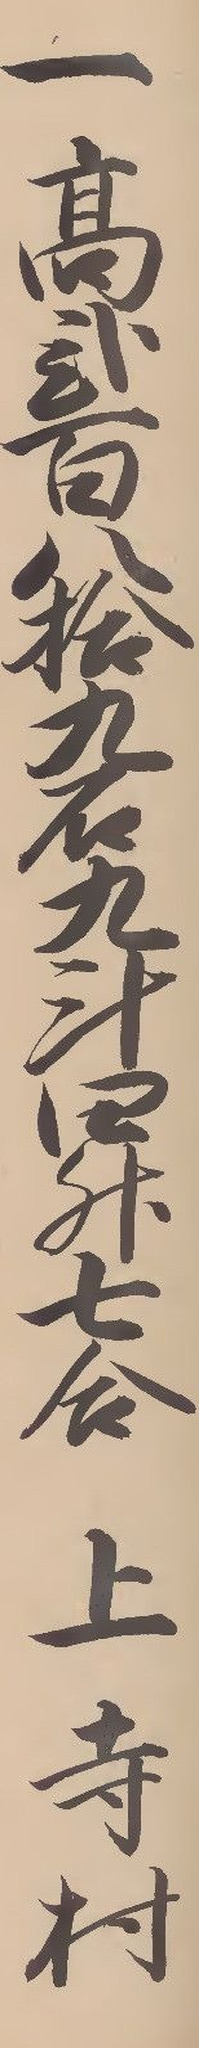一高弐百八拾九石九斗四升七合上寺村
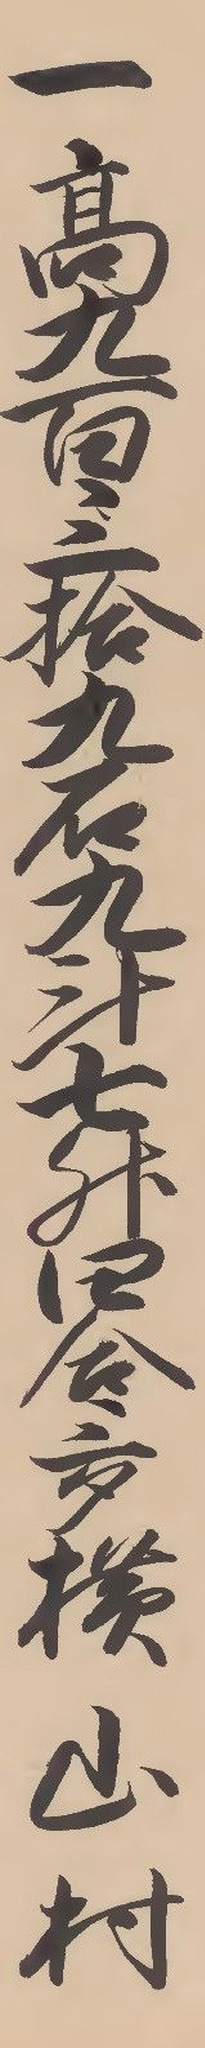一高九百三拾九石九斗七升四合三勺横山村
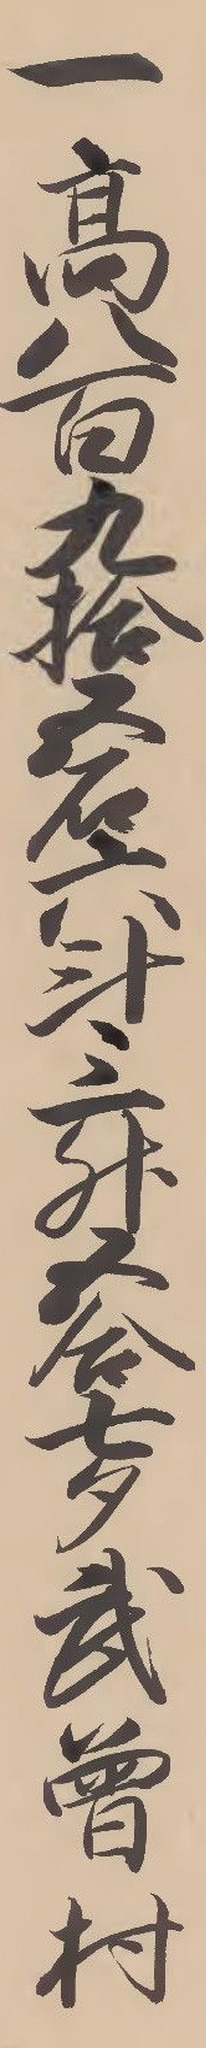一高八百九拾五石六斗三升五合七勺武曽村
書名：近江国郷帳
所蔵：国立公文書館 National Archives of Japan
